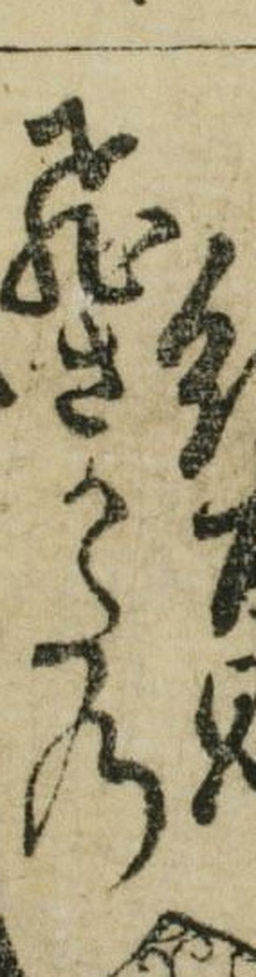ひさかたの
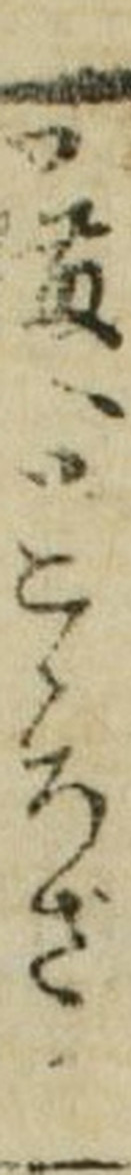御備へ御こゝろざし
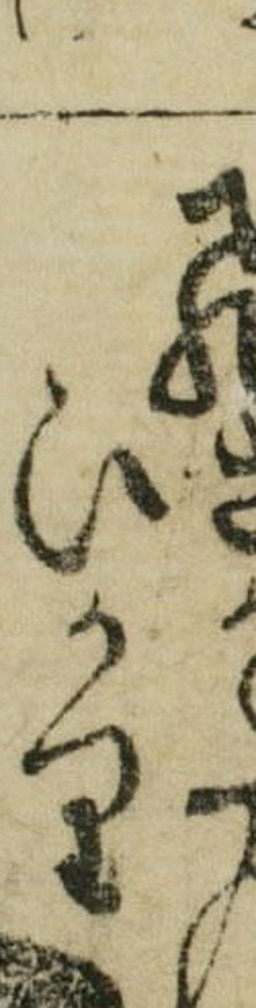ひかり
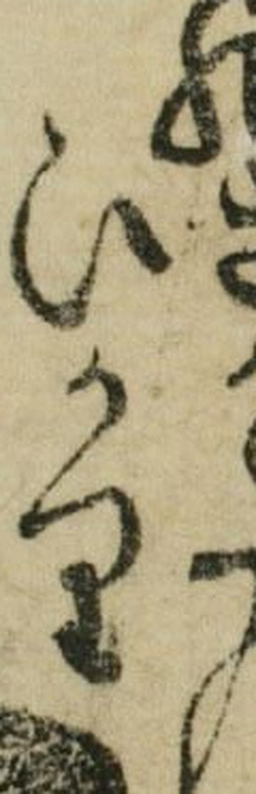ひかり
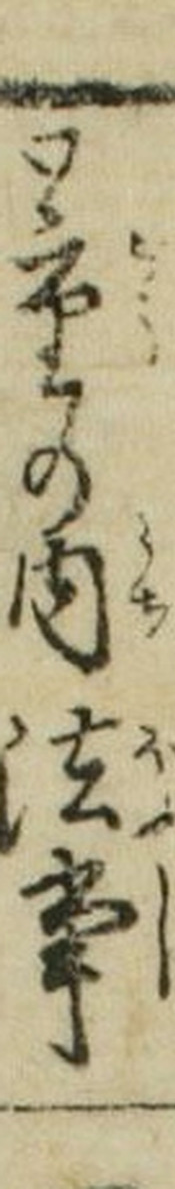御重の内法事
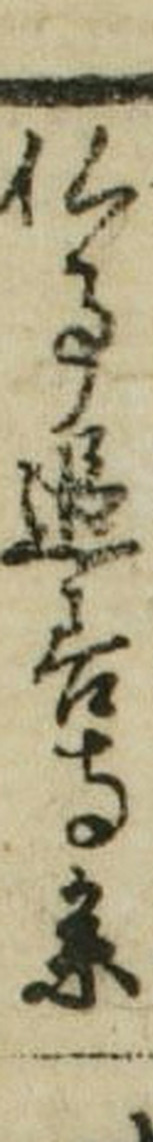仏事追善寺参
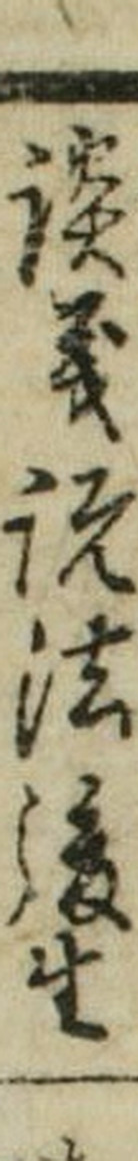談義説法後生
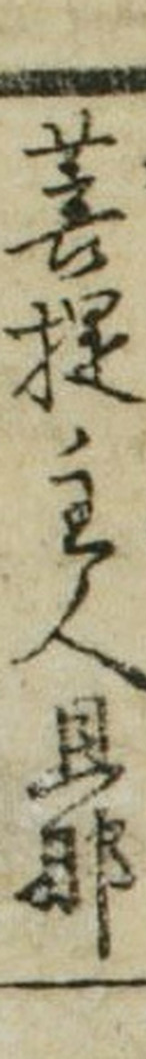菩提主人旦那
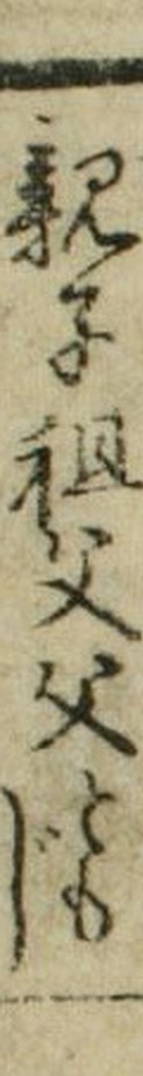親子祖父父ともじ
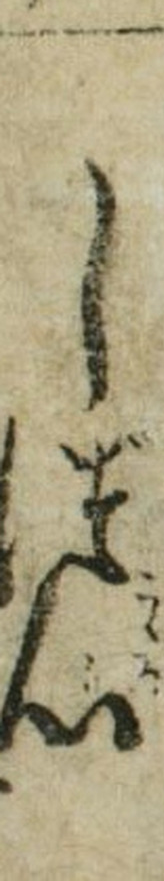しづ心
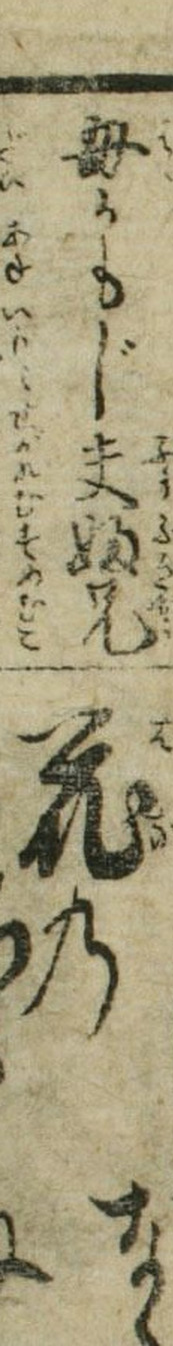母かもじ夫婦兄
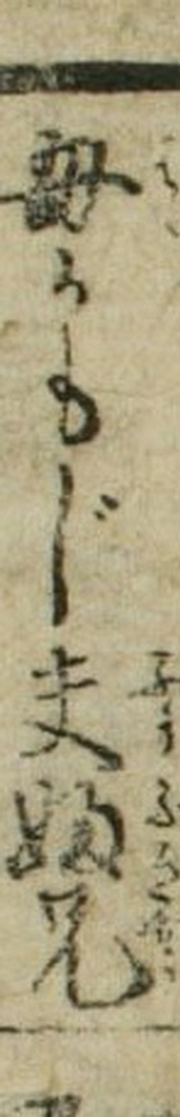母かもじ夫婦兄
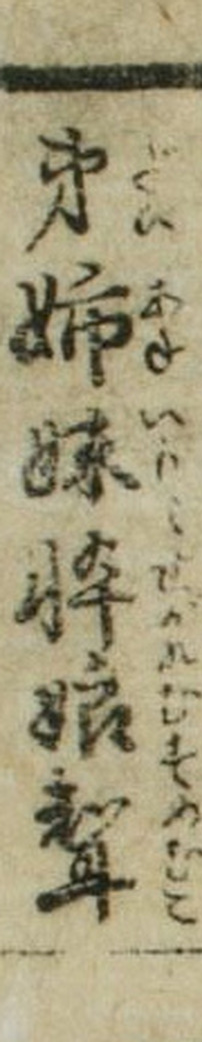弟姉妹悴娘聟
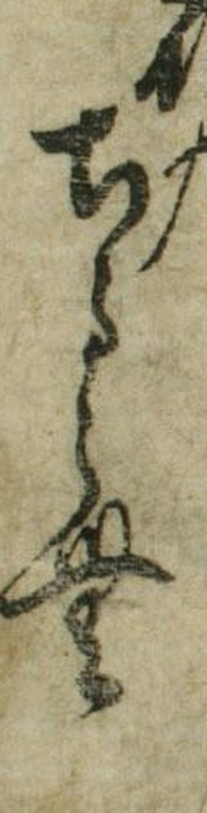ちるらむ

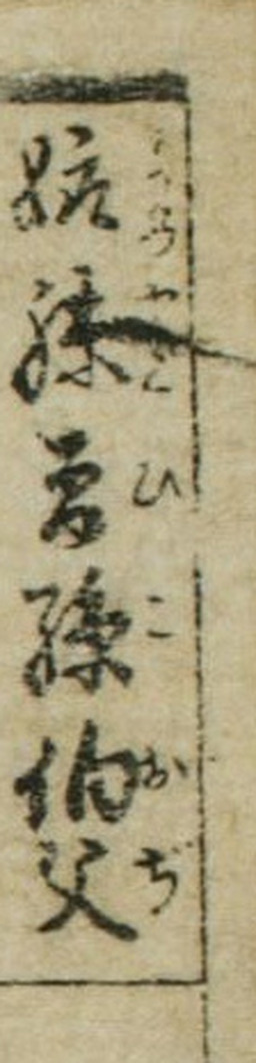娵孫曽孫伯父
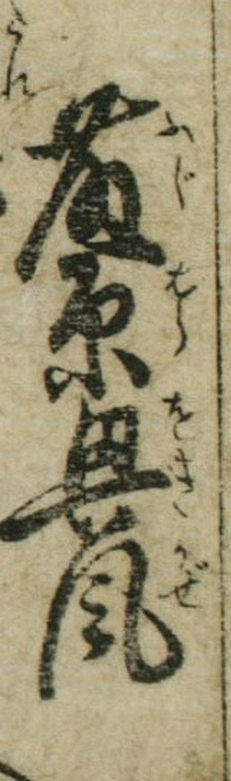藤原興風
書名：百人一首
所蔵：東京学芸大学教育コンテンツアーカイブ
